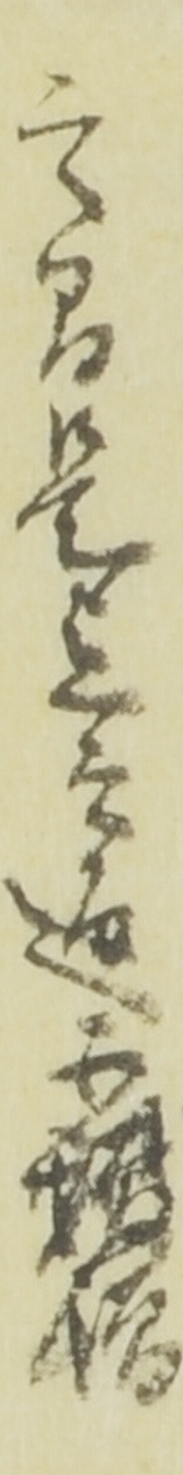之間是迄之通五割増
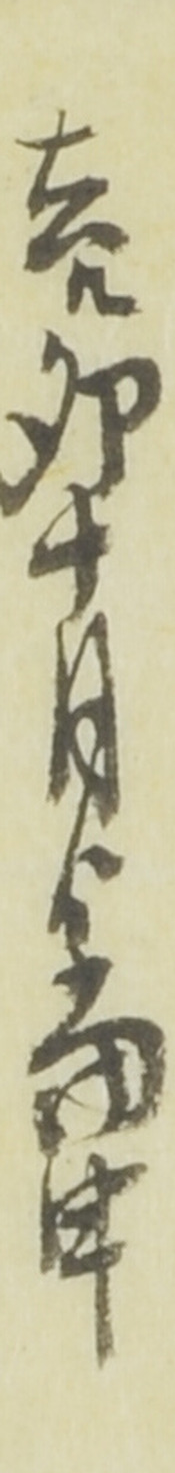去ル卯十月ゟ当申
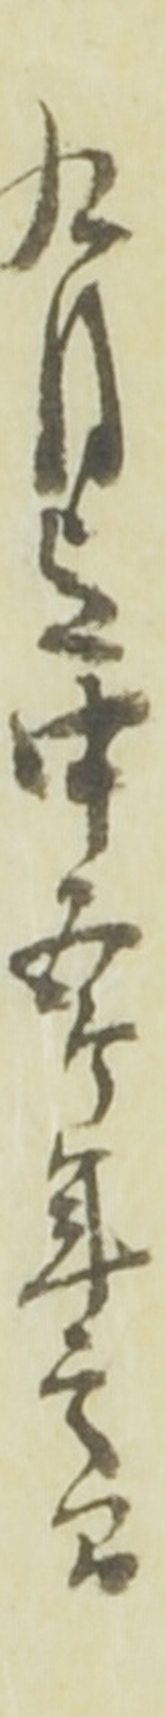九月迄中五ヶ年之間
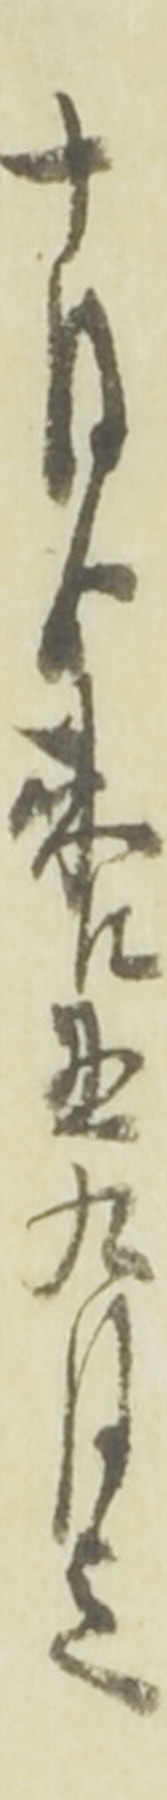十月ゟ来ル丑九月迄
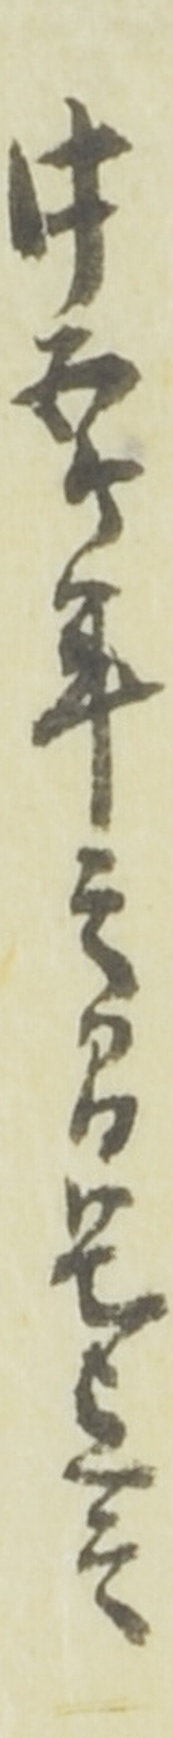中五ヶ年之間是迄之
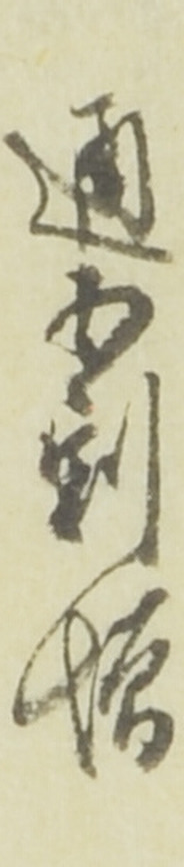通五割増
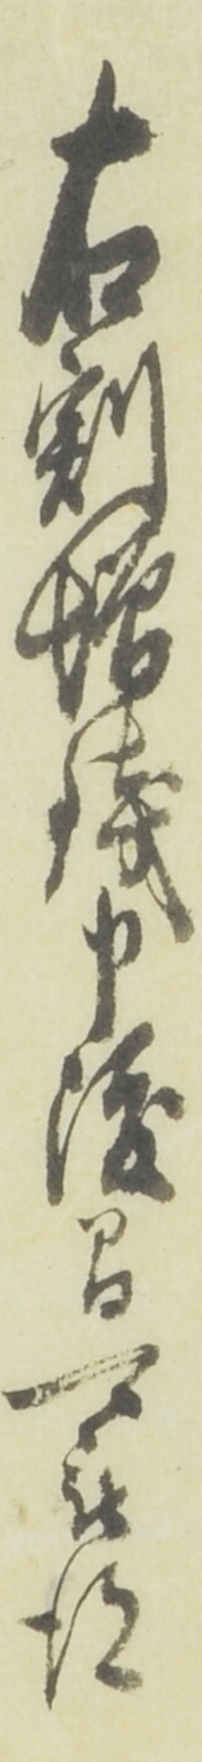右割増銭申渡間可被得
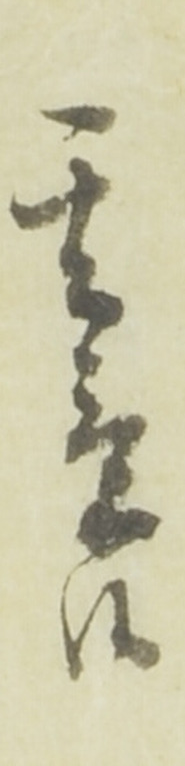其意候
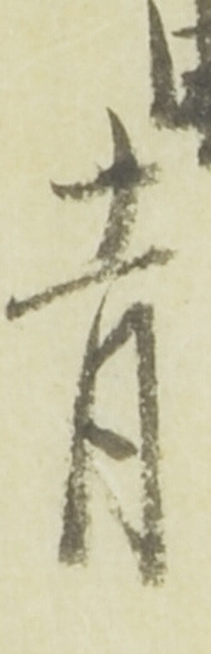十一月
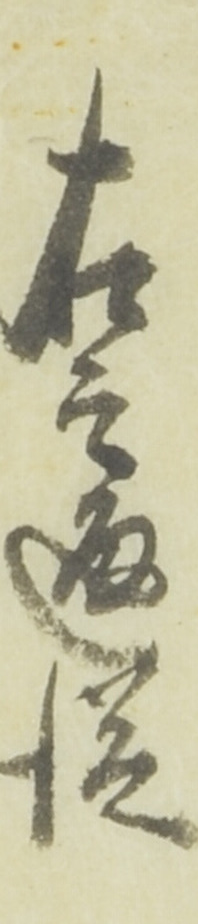右之通従
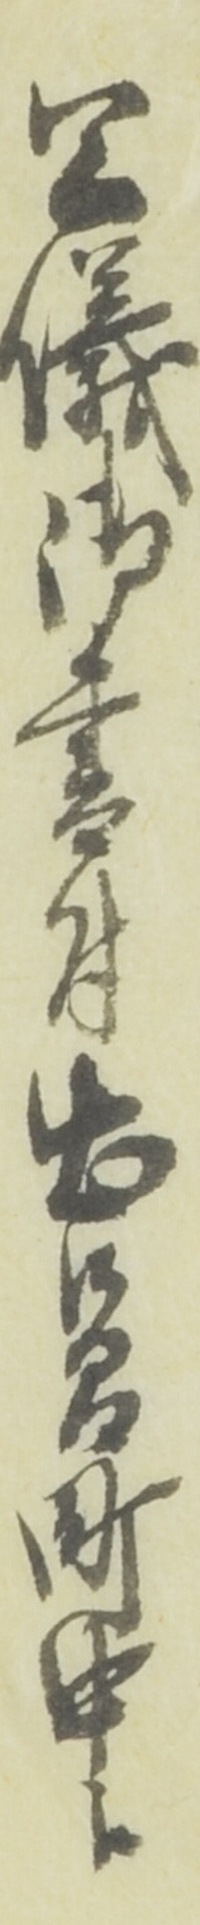公儀御書付出候間町中江
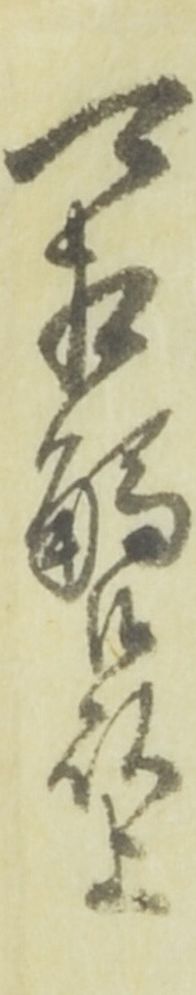可相触候以上

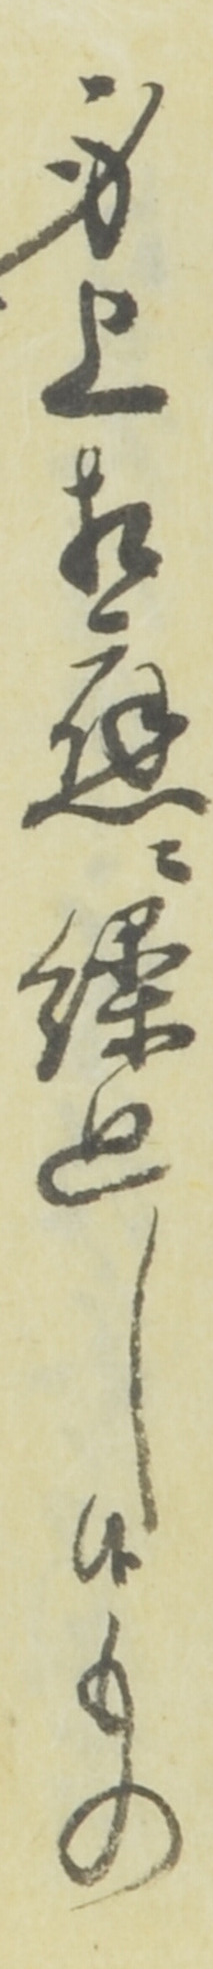身上相応ニ繰廻し候もの
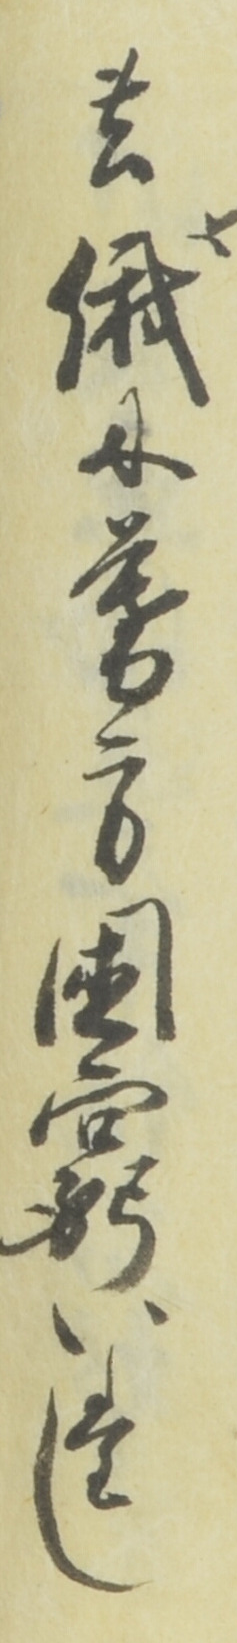共俄に暮方困窮いたし
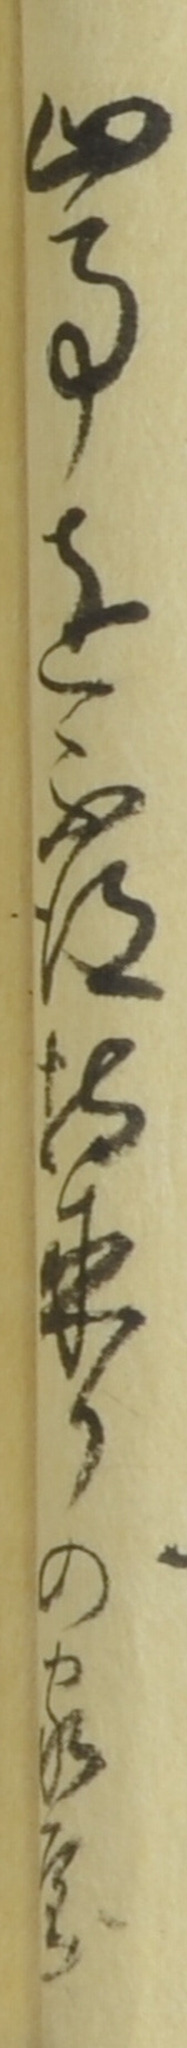心事を不得持来りの家屋
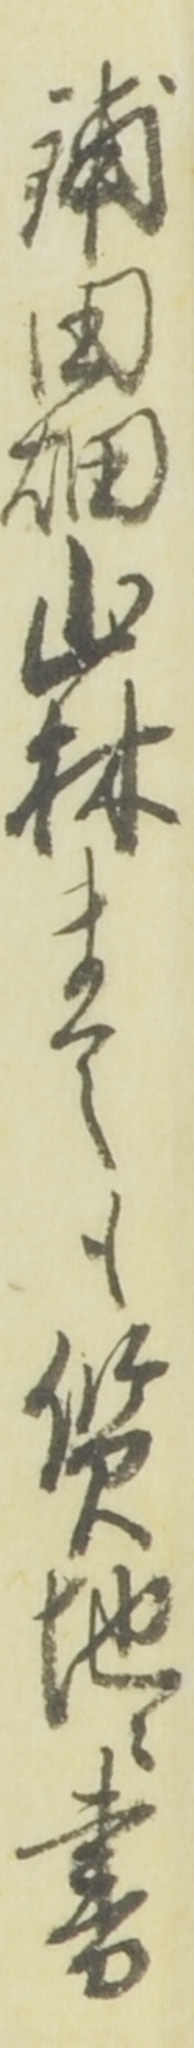鋪田畑山林まても質地ニ書
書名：御触書御書附控
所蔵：伊那市立高遠町図書館・合同会社AMANE
